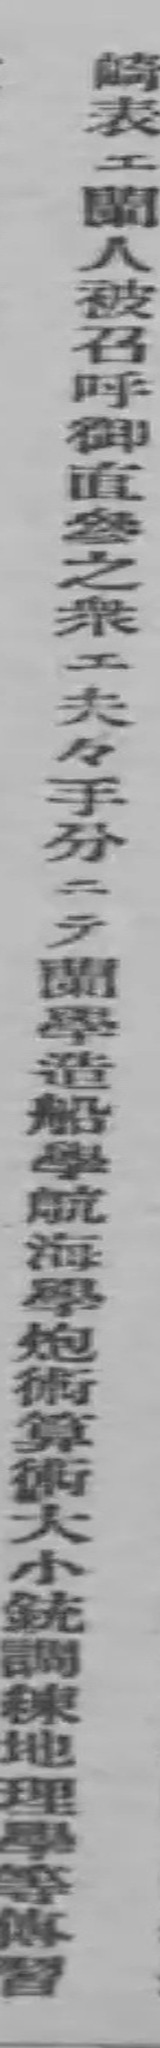崎表エ蘭人被召呼御直参之衆エ夫々手分ニテ蘭学造船学航海学炮術算術大小銃調練地理学等伝習
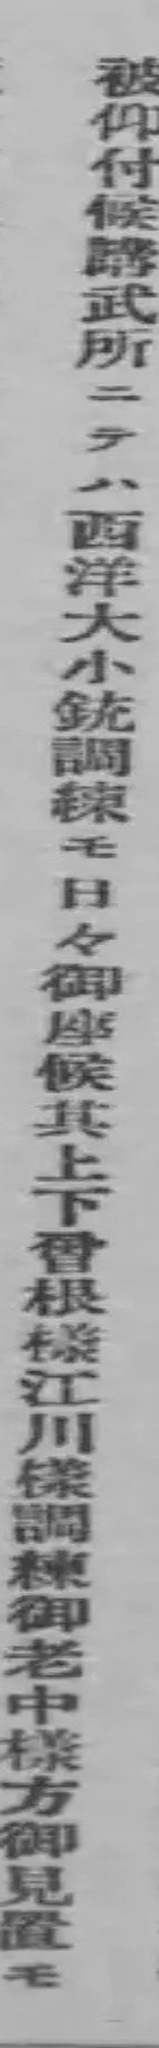被仰付候講武所ニテハ西洋大小銃調練モ日々御座候其上下曽根様江川様調練御老中様方御見置モ
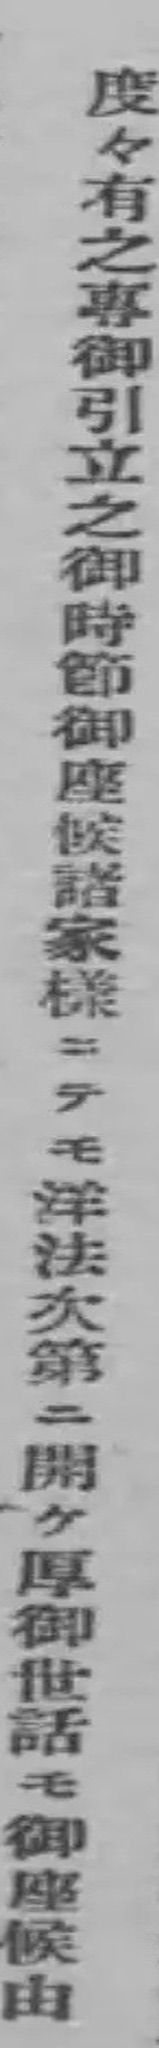度々有之専御引立之御時節御座候諸家様ニテモ洋法次第ニ開ケ厚御世話モ御座候由
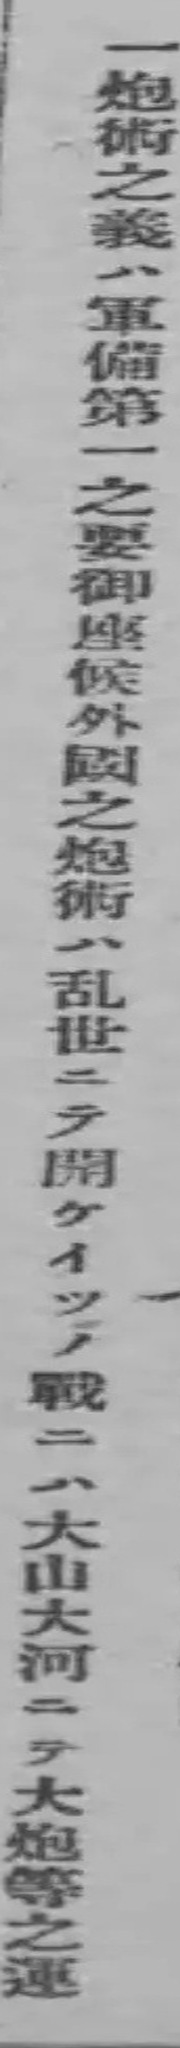一炮術之義ハ軍備第一之要御座候外国之炮術ハ乱世ニテ開ケイツノ戦ニハ大山大河ニテ大炮等之運
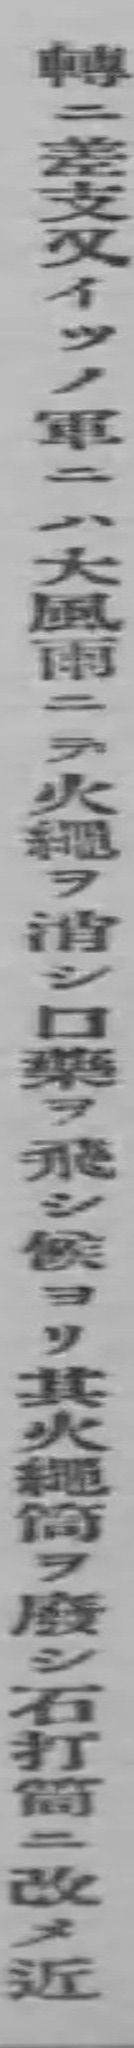転ニ差支又イツノ軍ニハ大風雨ニテ火縄ヲ消シ口薬ヲ飛シ候ヨリ其火縄筒ヲ廃シ石打筒ニ改メ近
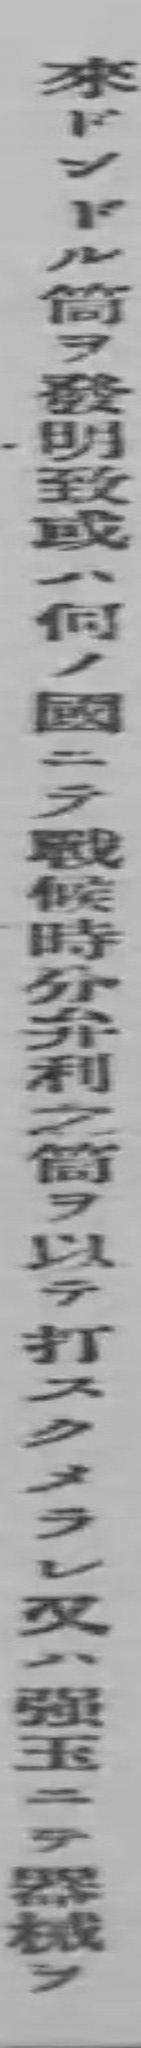来ドンドル筒ヲ発明致或ハ何ノ国ニテ戦候時分弁利之筒ヲ以テ打スクメラレ又ハ強玉ニテ器械ヲ
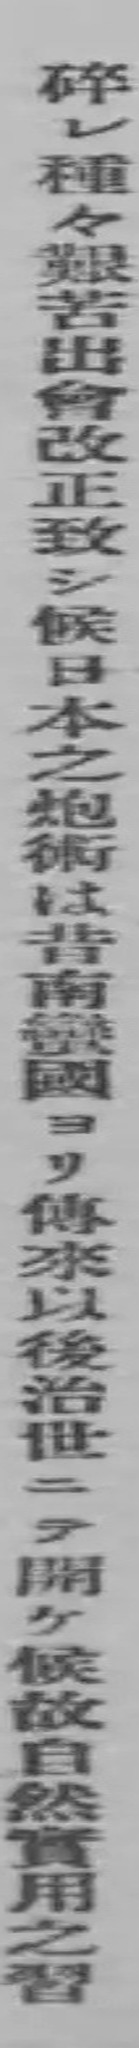砕レ種々艱苦出会改正致シ候日本之炮術は昔南蛮国ヨリ伝来以後治世ニテ開ケ候故自然実用之習
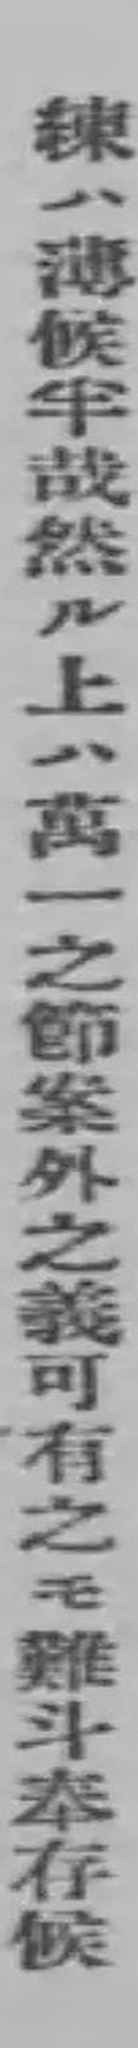練ハ薄候半哉然ル上ハ万一之節案外之義可有之モ難斗奉存候
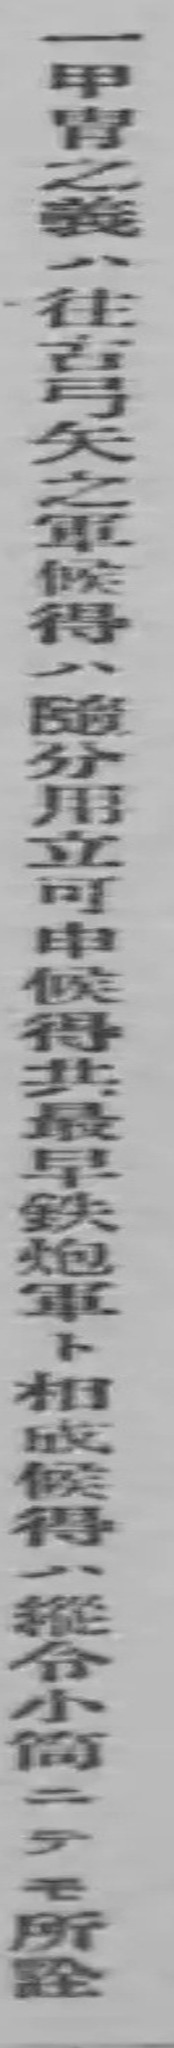一甲冑之義ハ往古弓矢之軍候得ハ随分用立可申候得共最早鉄炮軍ト相成候得ハ縦令小筒ニテモ所詮
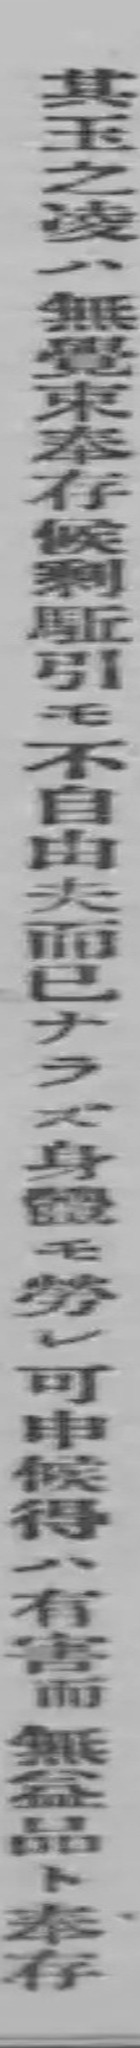其玉之凌ハ無覚束奉存候剰駆引モ不自由夫而巳ナラズ身體モ労レ可申候得ハ有害而無益品ト奉存
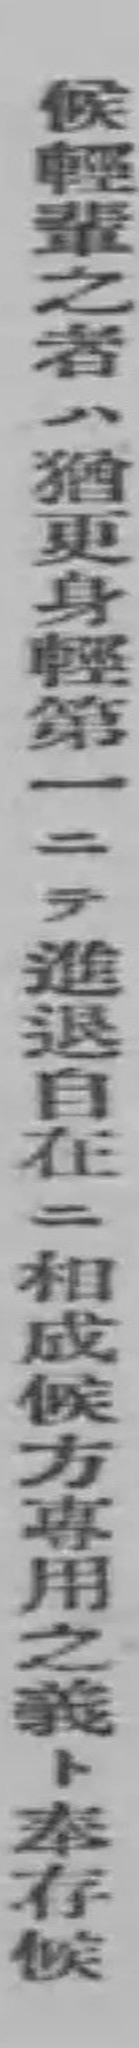候軽輩之者ハ猶更身軽第一ニテ進退自在ニ相成候方専用之義ト奉存候
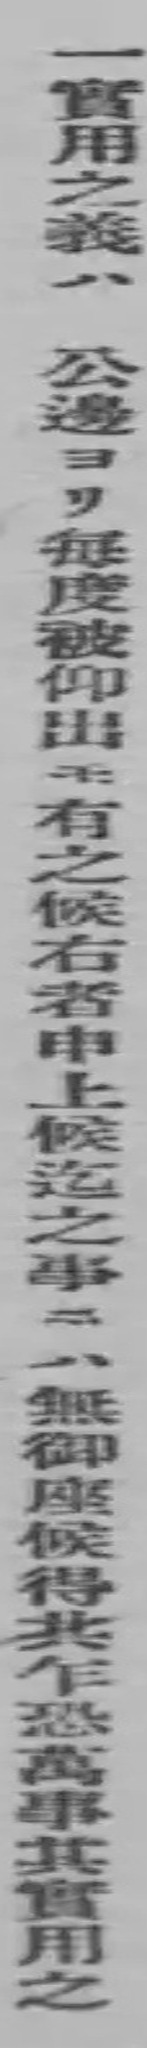一実用之義ハ公辺ヨリ毎度被仰出モ有之候右者申上候迄之事ニハ無御座候得共乍恐万事其実用之
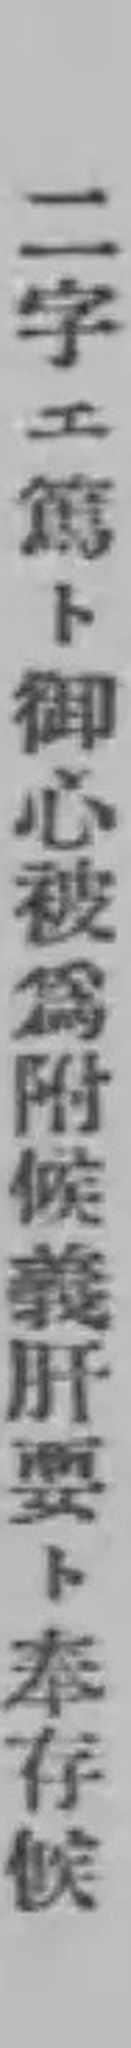二字エ篤ト御心被為附候義肝要ト奉存候
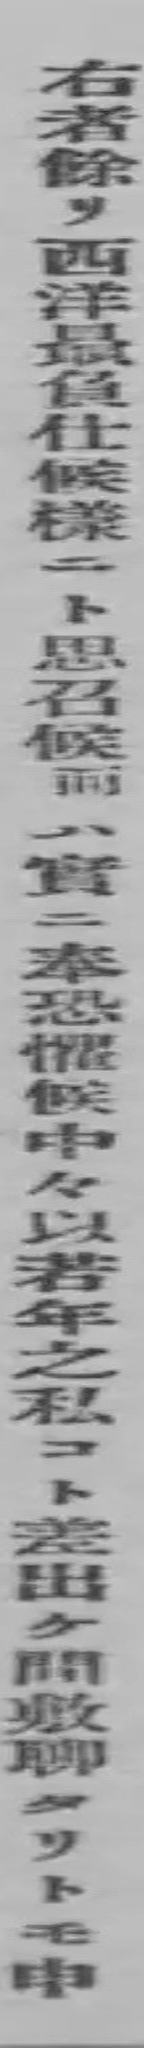右者余リ西洋贔負仕候様ニト思召候而ハ実ニ奉恐懼候中々以若年之私コト差出ケ間敷聊タリトモ申
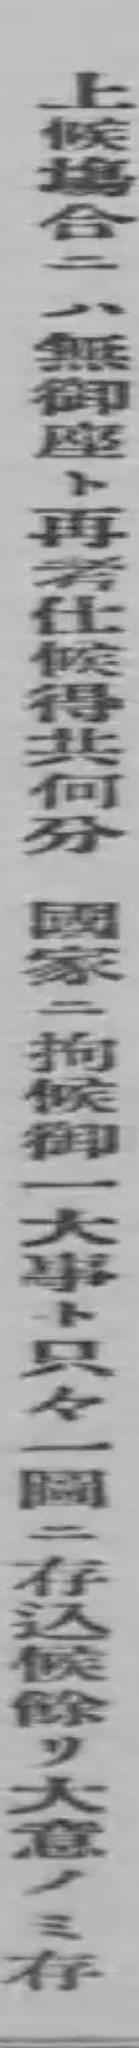上候場合ニハ無御座ト再考仕候得共何分国家ニ拘候御一大事ト只々一図ニ存込候余リ大意ノミ存
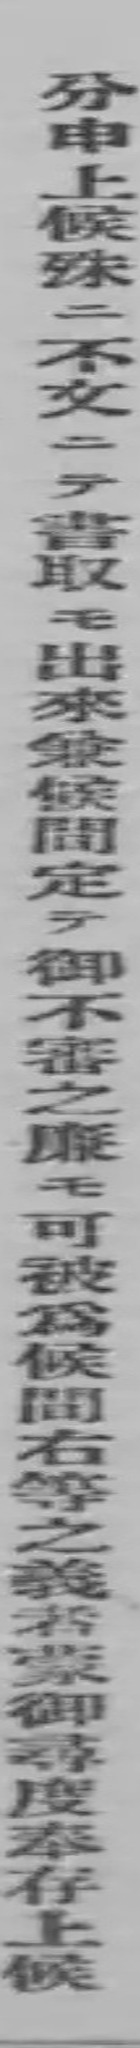分申上候殊ニ不文ニテ書取モ出来兼候間定テ御不審之廉モ可被為候間右等之義者蒙御尋度奉存上候
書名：豊橋市史談
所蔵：国立国会図書館 National Diet Library, JAPAN
